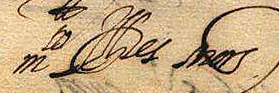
mto Ill̄res snors̄
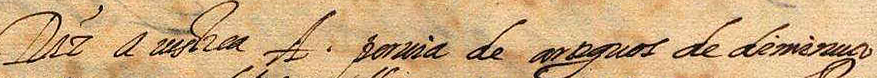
Diz a iustica A. por uia de artiguos de diminuto
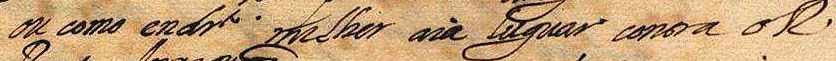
ou como en drto. milhor aia luguar contra o R.
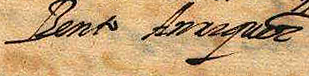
Bento Anriquez
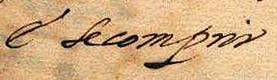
E se comprir
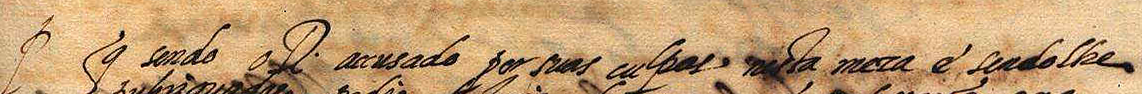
P q̄ sendo o R. acusado por suas culpas nesta meza e sendolhe
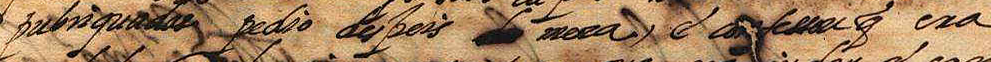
pubriquadas pedio despois _ meza, e confessou q̄ era
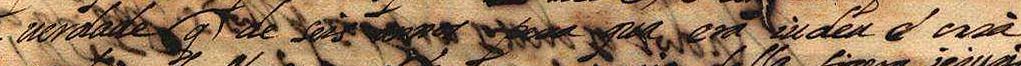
uerdade q̄ de seis annos pera qua era iudeu e cria
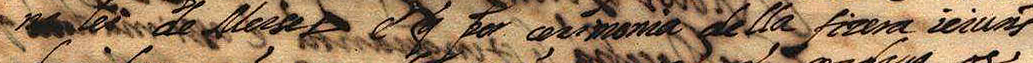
na lei de Moises e q̄ por cerimonia della fizera ieiuns
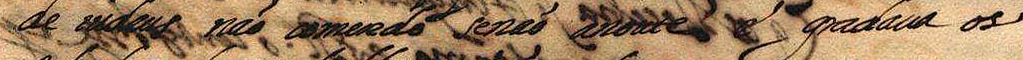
de iudeus naõ comendo senaõ a noute e gradaua os
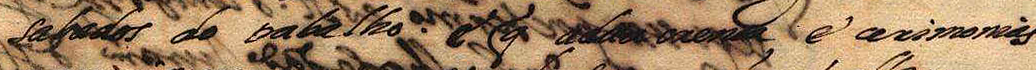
sabados do trabalho e q̄ a dita crença e cerimonias
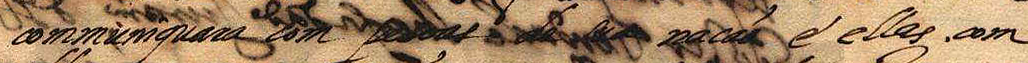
communiquara com pesoas de sua naçaõ e ellas com
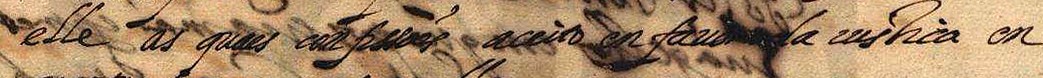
elle as quaes confissoẽs aceito en fauor da iustiça en
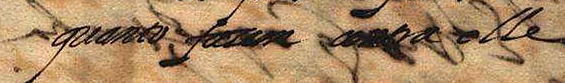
quanto fazem contra elle
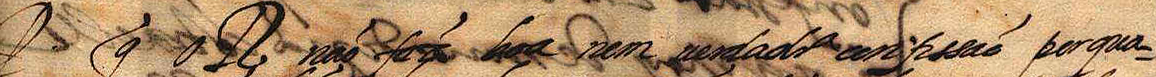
P. q̄ o R. naõ fez boa nem uerdadra confissaõ porqua
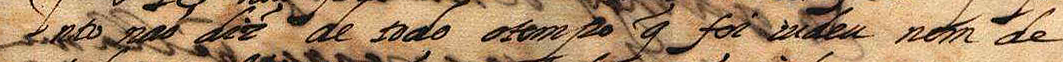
nto naõ diz de todo o tempo q̄ foi iudeu nem de
